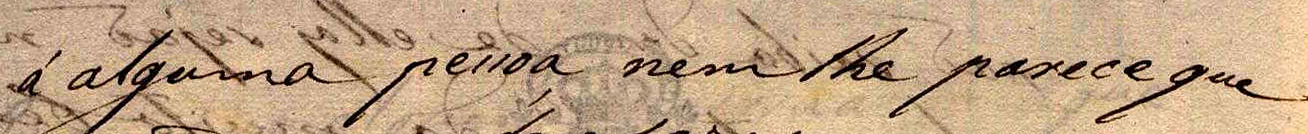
á alguma pessoa nem lhe parece que
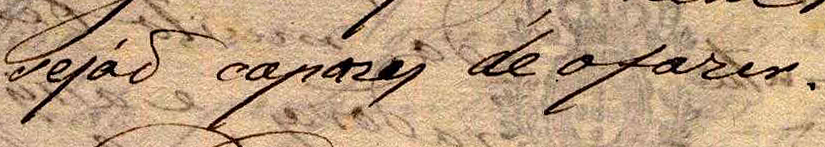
sejaõ capazes de o fazer.
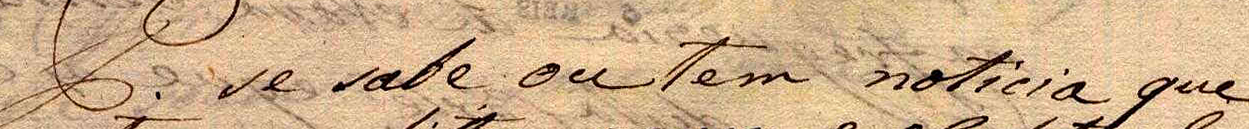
P. se sabe ou tem noticia que
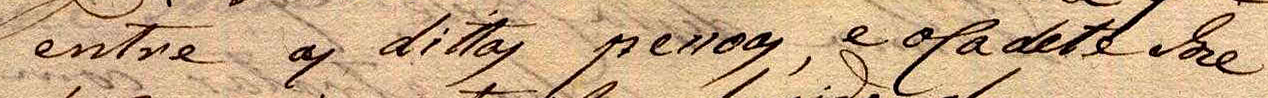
entre as dittas pessoas, e o Cadete Ioze
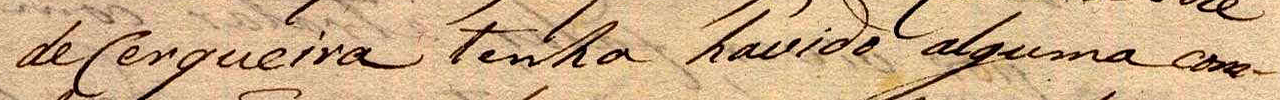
de Cerqueira tenha havido alguma com
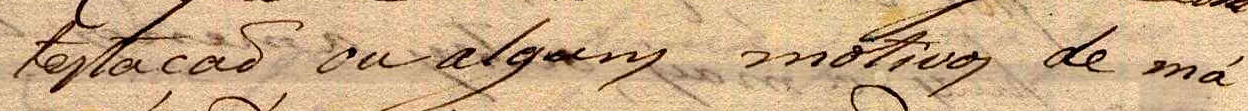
testaçaõ ou alguns motivos de má
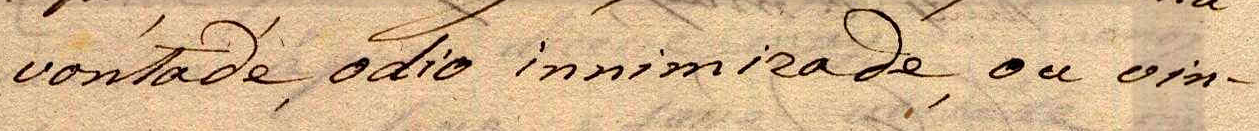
vontade, odio innimizade ou vin
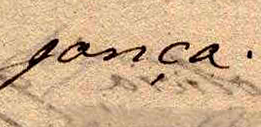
gança.
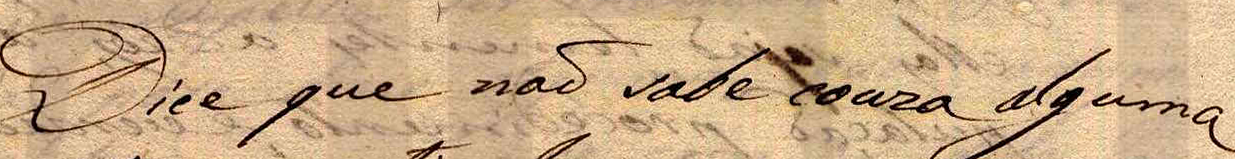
Dice que naõ sabe couza alguma
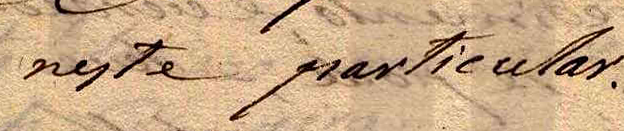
neste particular.
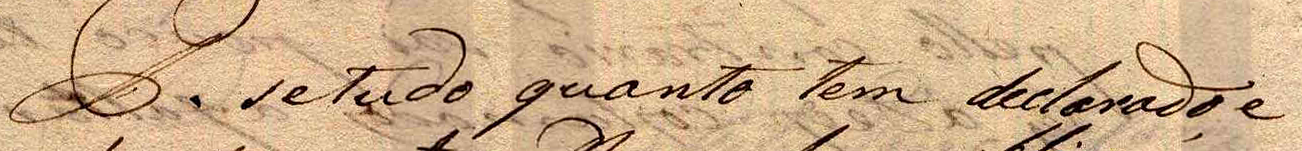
P. se tudo quanto tem declarado, e
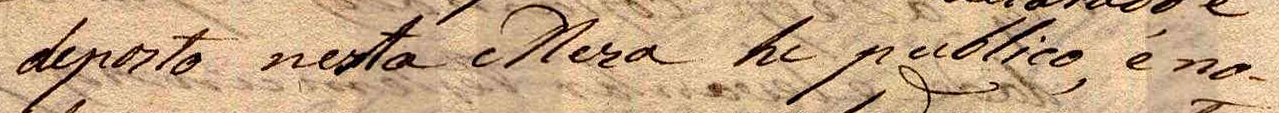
deposto nesta Meza he publico, e no
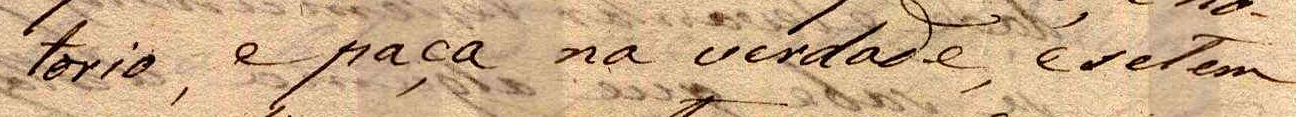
torio, e paça na verdade, e se tem
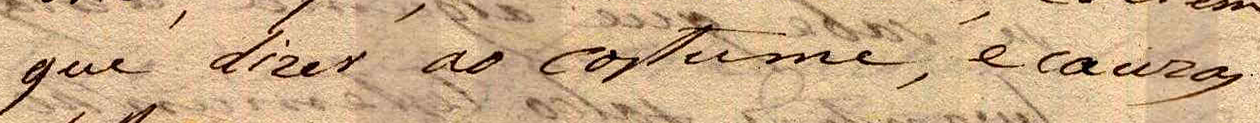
que dizer ao costume, e cauzas
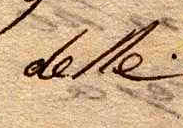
delle.
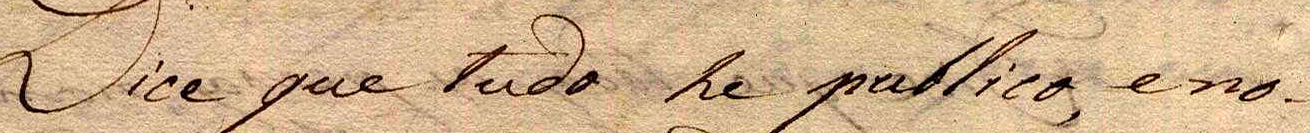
Dice que tudo he publico, e no
